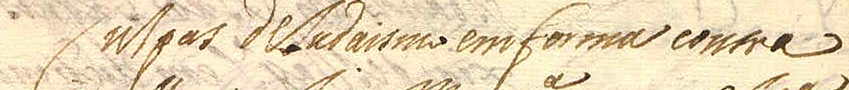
Culpas de Iudaismo em forma contra
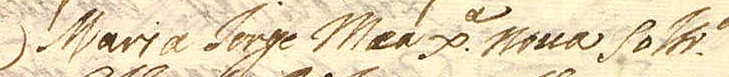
Maria Iorge Mea x.a noua soltr.a
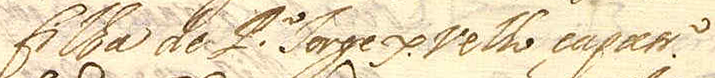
filha do P.o Iorge x. velho çapatr.o
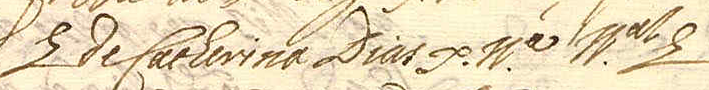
E de Catherina Dias x. n.a nal E
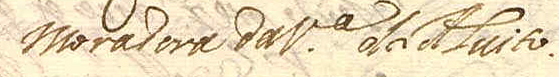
moradora da V.a de Aluito.
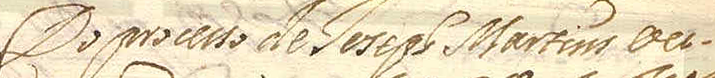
Do processo de Iozeph Martin̄s ou
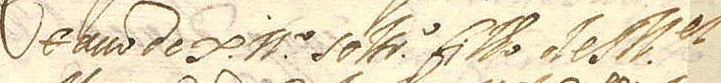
tauo de x. n.o soltr.o filho de M.el
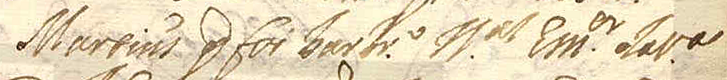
Martin̄s q̄ foi barbr.o N.al E m.or da V.a
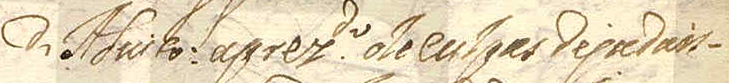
de Aluito: aprez.do de culpas de judais
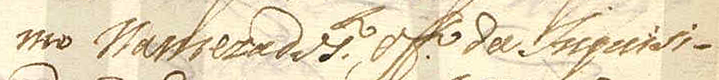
mo na meza do s.to off.o da Inquisi
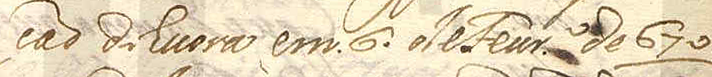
çaõ de Euora em. 6. de Feur.o de 670
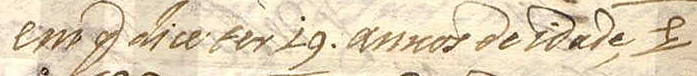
em q̄ dice ter i9. annos de idade, E
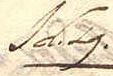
Id.19.
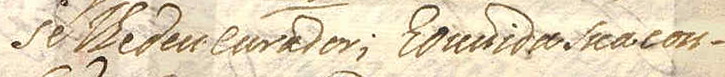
se lhe deu curador; E ouuida sua con
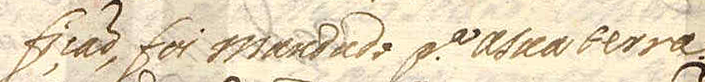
fiçaõ, foi mandado p.a a sua terra.
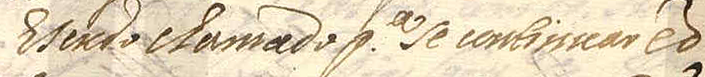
E sendo chamado p.a se continuar cō
